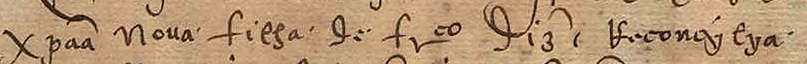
Xpāa noua filha de frco dīz, Reconcylya
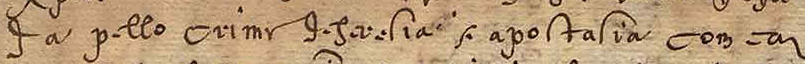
da pello crime de heresia e apostasia com car
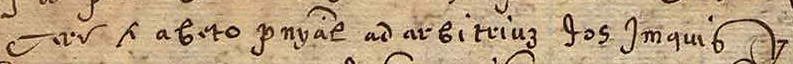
cere e abeto pnȳal ad arbitriuz dos Jmquisy
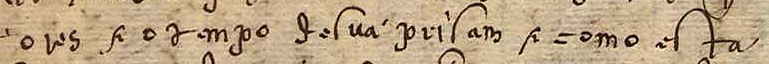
dores e o tempo de sua prisam e como esta
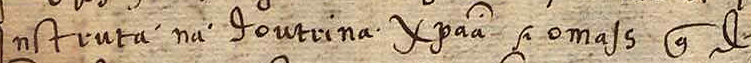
Jnstruta na doutrina Xpaā e o majs q̄ de
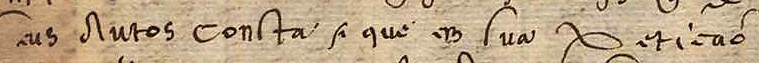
seus Autos consta e que em sua petiçaõ
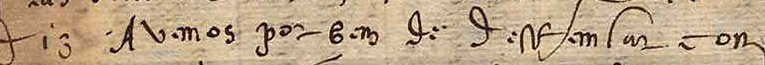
diz Avemos por bem de despemsar com
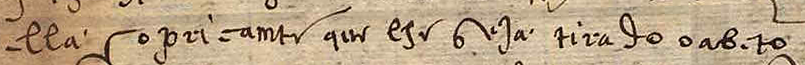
ella sopricamte que lhe seja tirado o abito
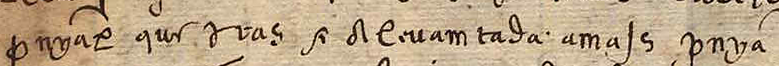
pnȳaL que tras e Aleuamtada a majs pnyā
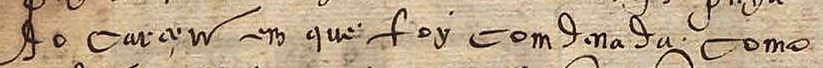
do carcere em que foy comdenada como
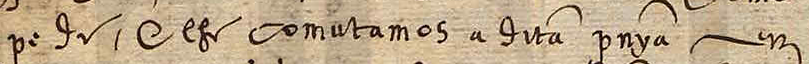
pede, e lhe comutamos a ditā pnȳa em
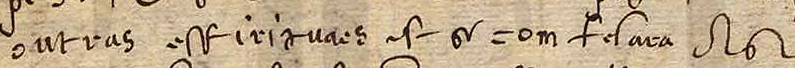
outras espirituaes .s. se comfesara As
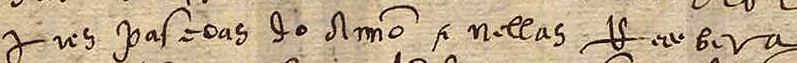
tres pascoas do Ann̄o e nellas Recebera
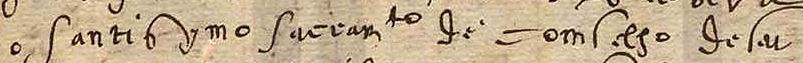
o santisymo sacramto de comselho de seu
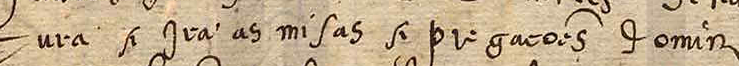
Cura e Jrá as misas e pregaçoēs domim
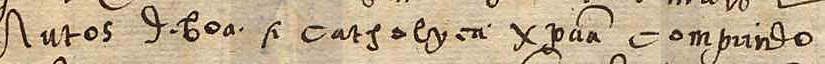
Autos de boa e catholyca xpāa comprindo
